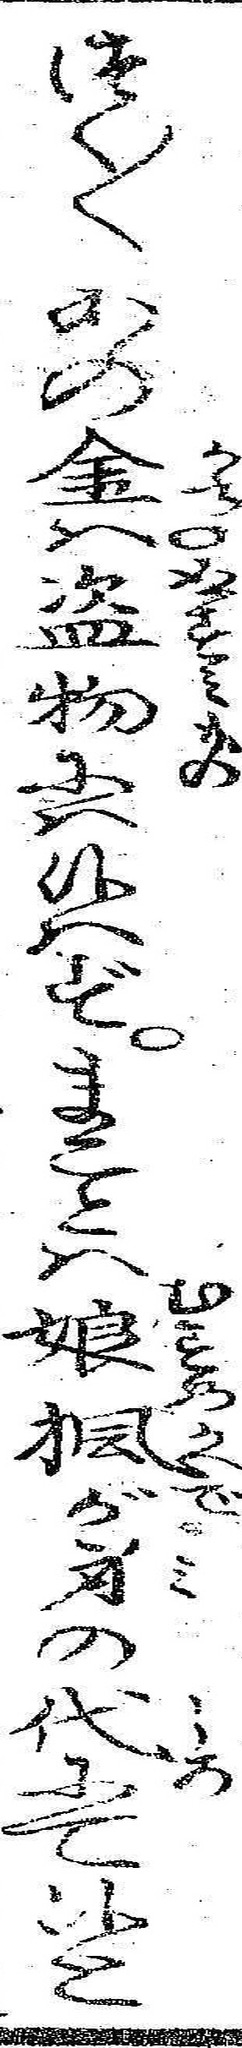つく〳〵あの金は。盗物には候はず。まことは娘楓が身の代にて候と
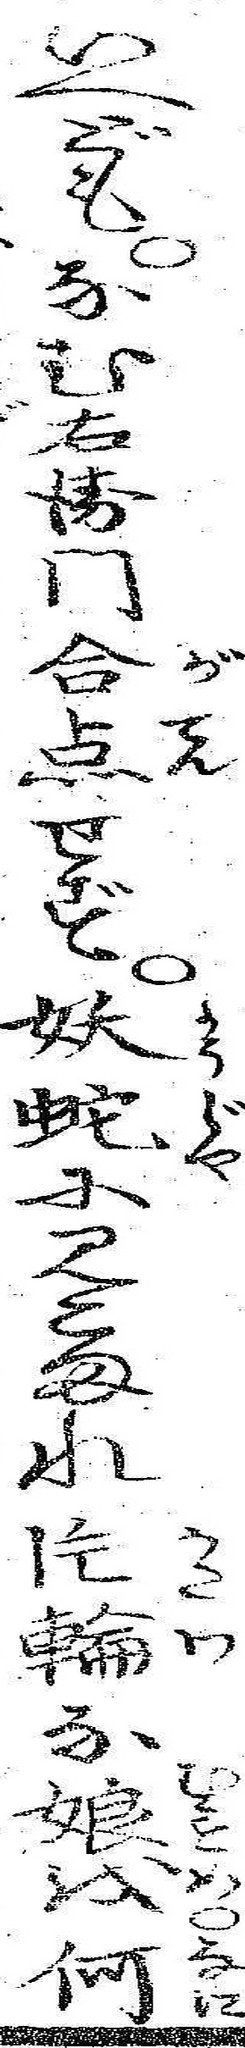いへども。なむ右衛門合点せず。妖蛇に見こまれ片輪な娘を。何
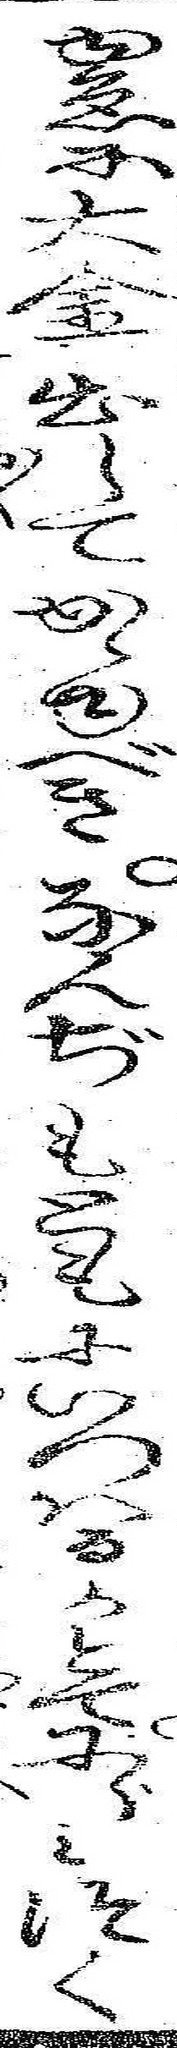ゆゑに大金出してかゝゆべき。なんぢもともにいつはるかとて。にらみつく
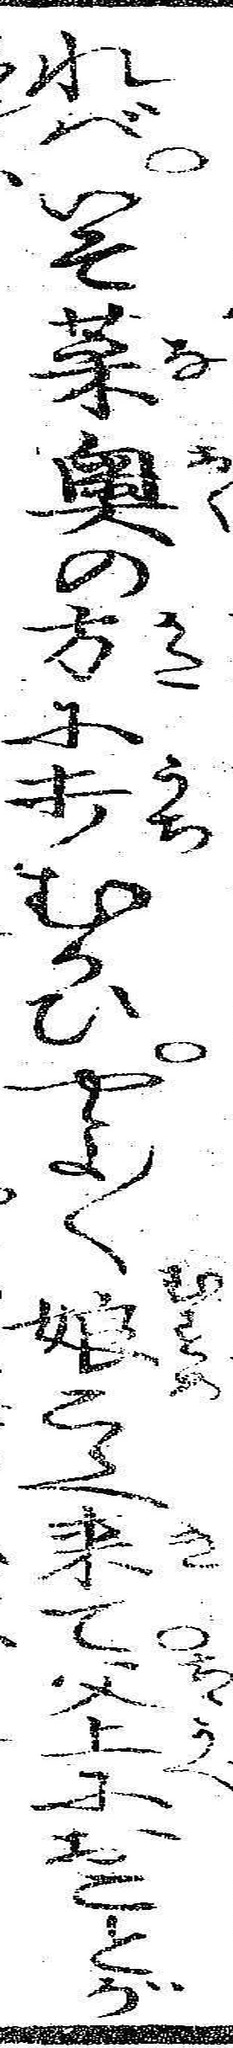れば。いそ菜奥の方に打むかひ。やよ〳〵娘こゝへ来て。父上におことが
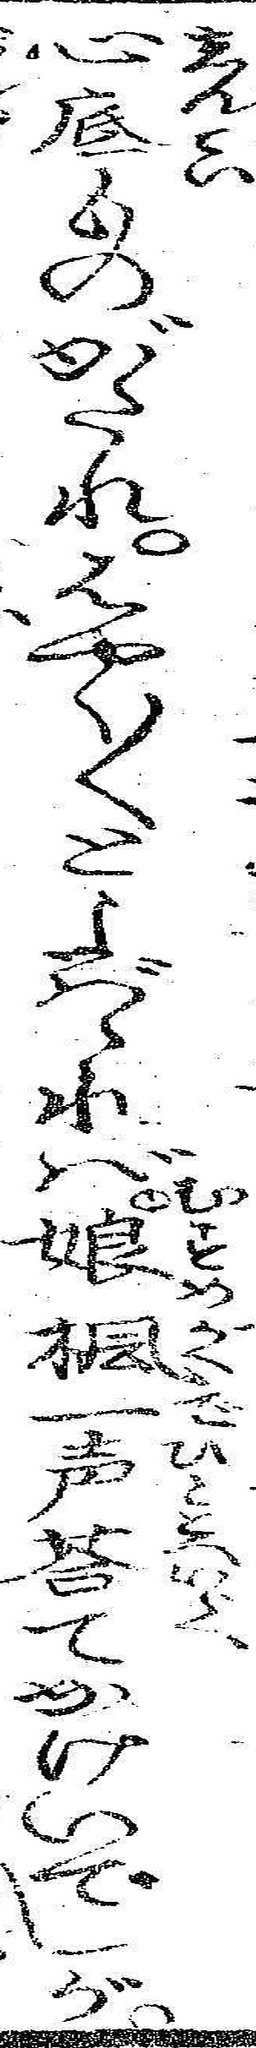心底ものがたれ。はやく〳〵とよばゝれば。娘楓一声荅てかけいでしが。
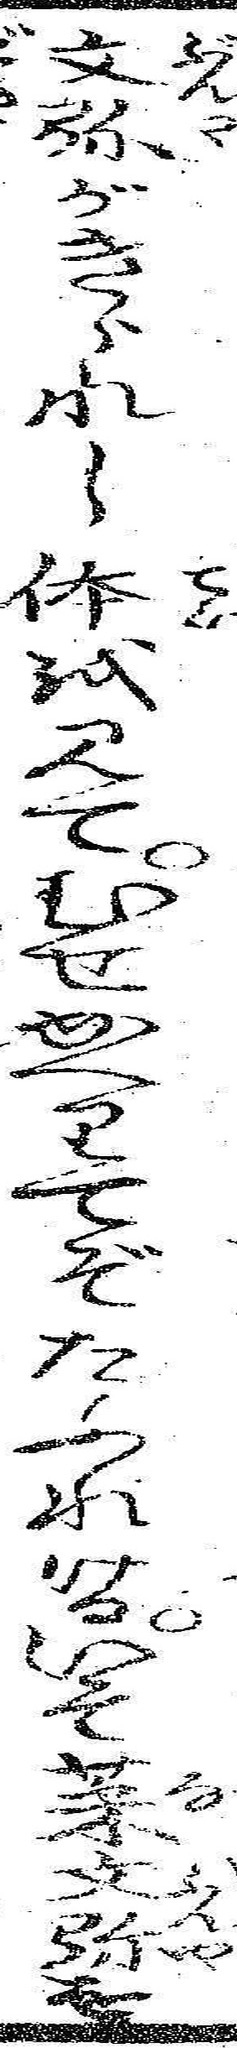文弥がきられし体を見て。むせかへりてぞたふれける。いそ菜文弥を
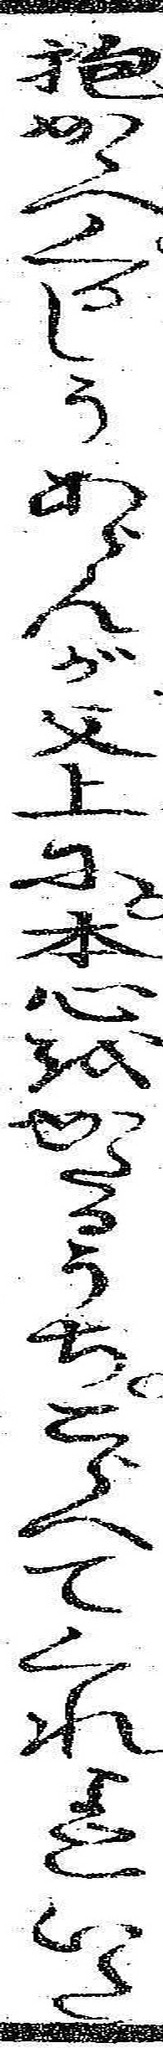抱かゝへ。くるしうあらんが父上に本心をかたるうち。こらへてくれよといた
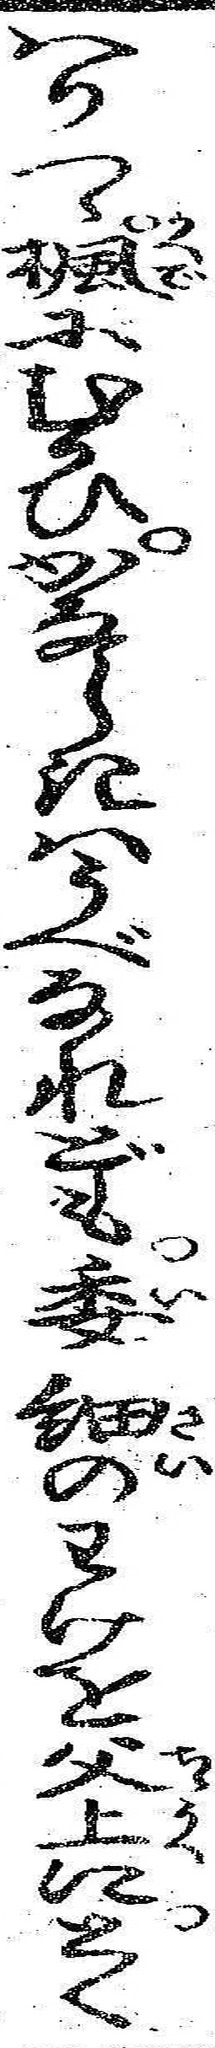はりつゝ。楓にむかひ。かなしきはうべなれども。委細のわけを父上に。とく
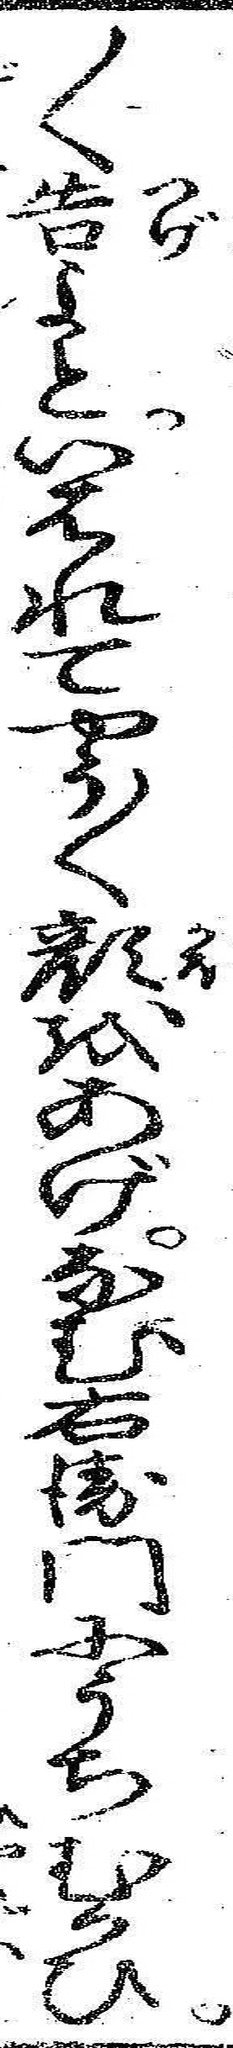〳〵告よと。いはれてやう〳〵顔をあげ。なむ右衛門にうちむかひ。
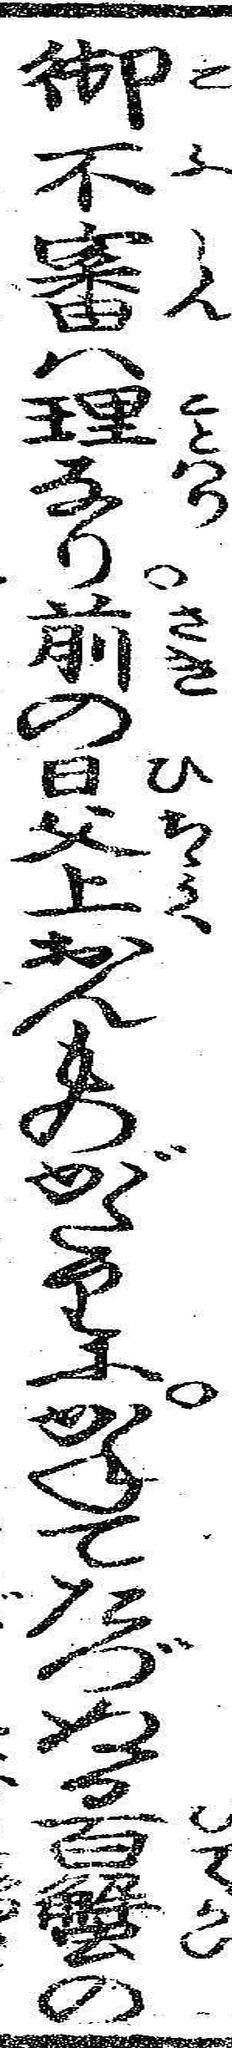御不審は理なり。前の日父上おんものがたりに。かねてたづぬる百蟹の
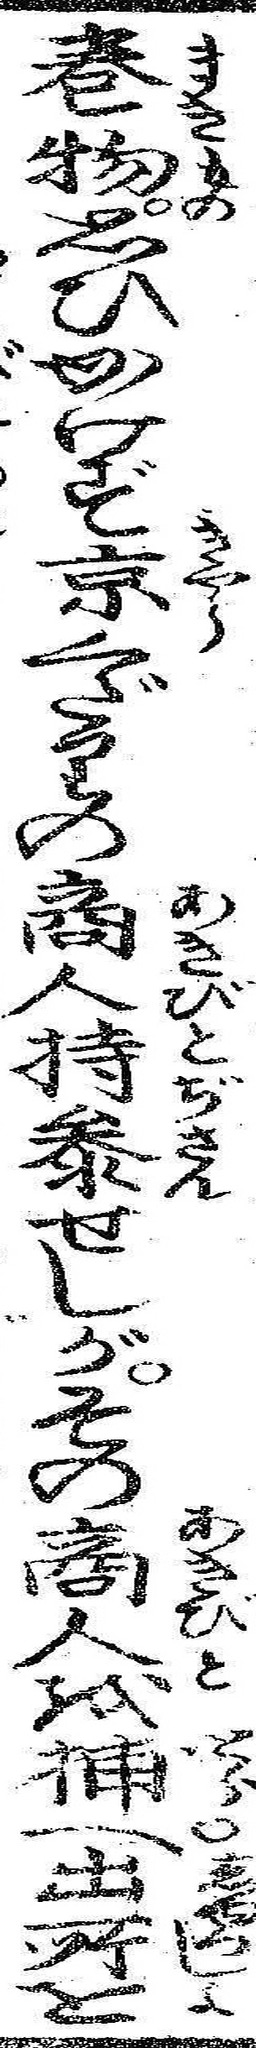巻物。思ひかけず京くだりの商人持参せしが。その商人を捕へ。出所を
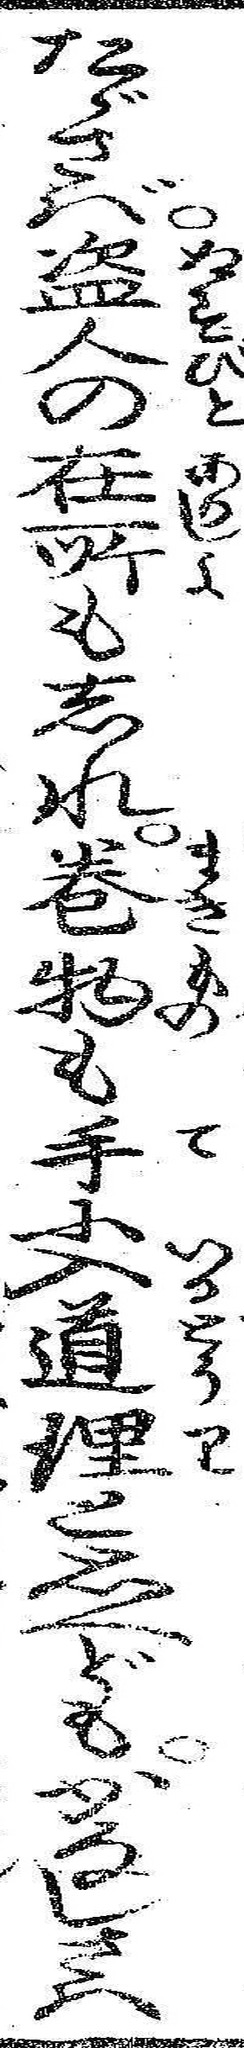たゞさば。盗人の在所もしれ。巻物も手に入道理と思へども。かなしさは
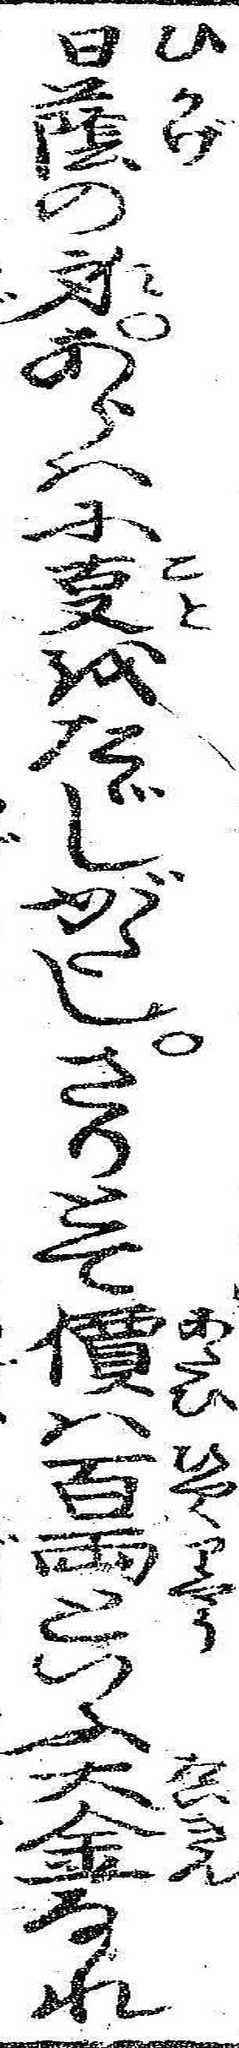日蔭の身。あらはに事をたゞしがたし。さりとて価は百両といふ大金なれ
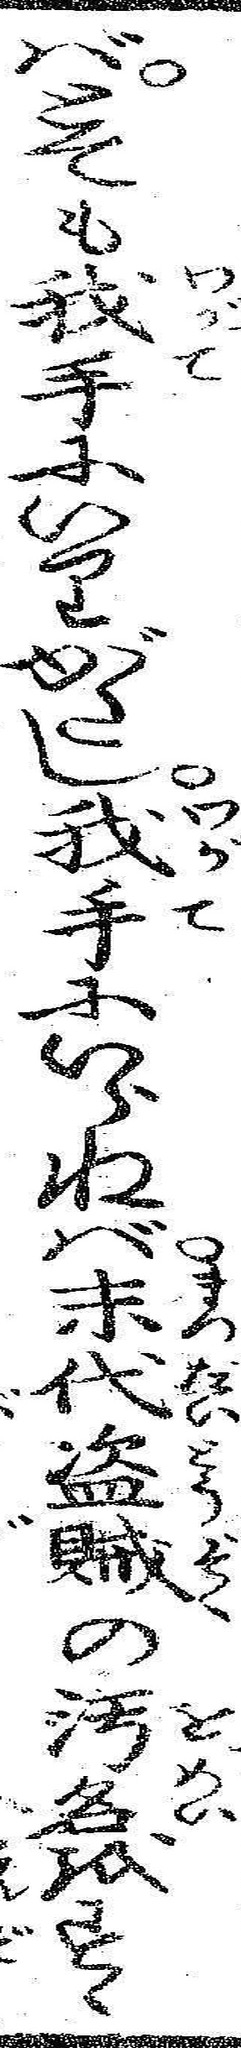ば。とても我手にいりがたし。我手にいらねば。末代盗賊の汚名をすゝ
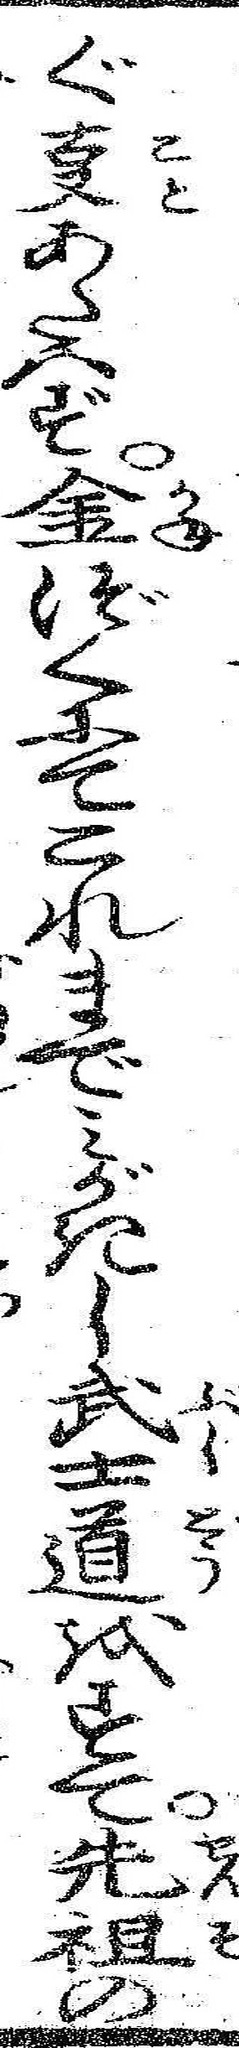ぐ事あたはず。金づくにてこれまでみがきし武士道をすて。先祖の
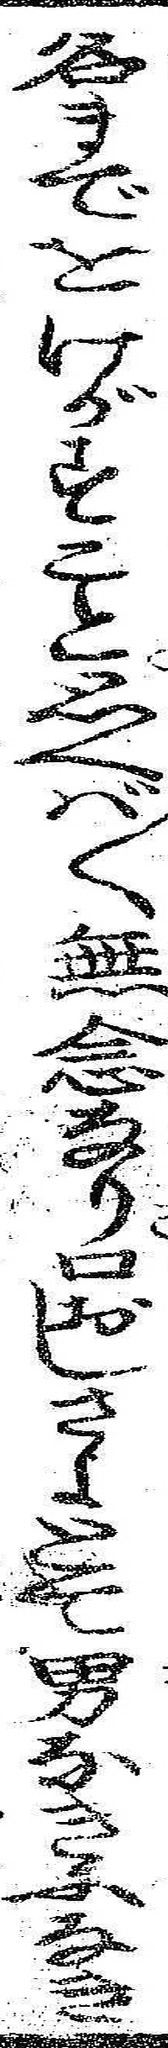名までをけがすこと。思へば〳〵無念なり。口おしさよとて男なきになき
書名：昔話稲妻表紙
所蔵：国文学研究資料館
